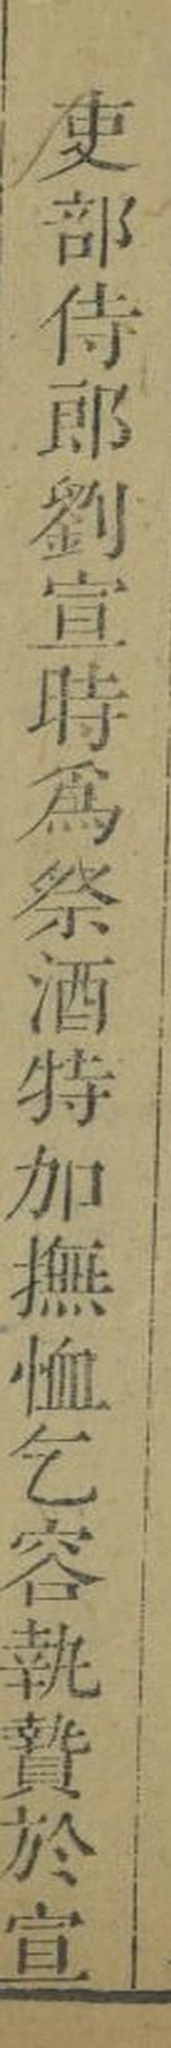吏部侍郎劉宣時為祭酒特加撫恤乞容執贄於宣
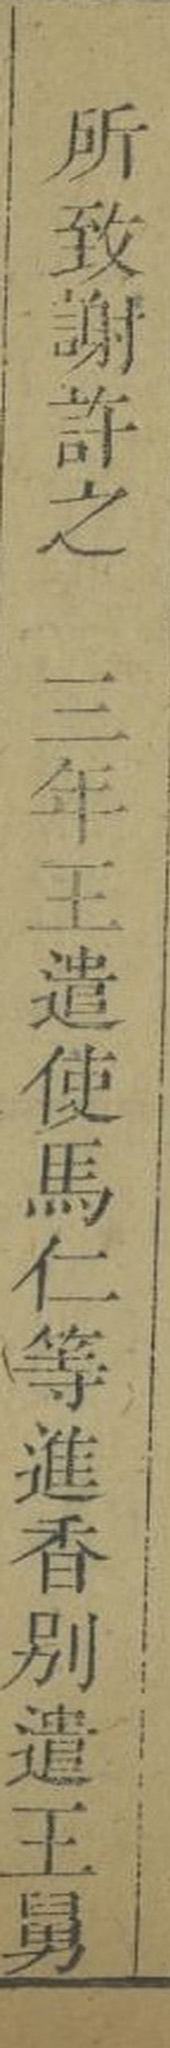所致謝許之三年王遣使馬仁等進香別遣王舅
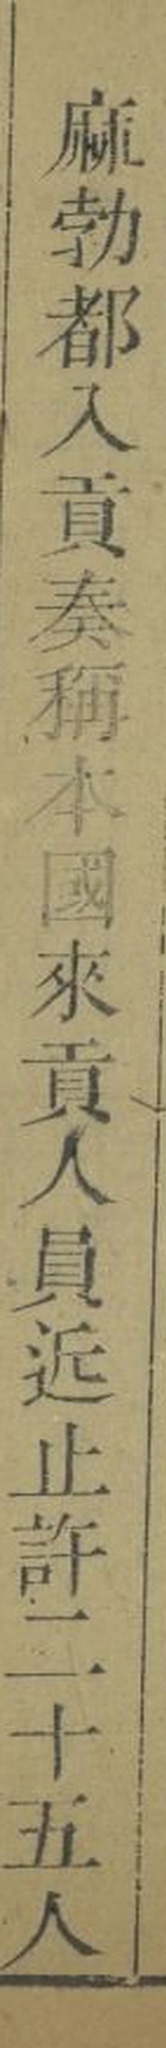麻勃都入貢奏称本国来貢人員近止許二十五人
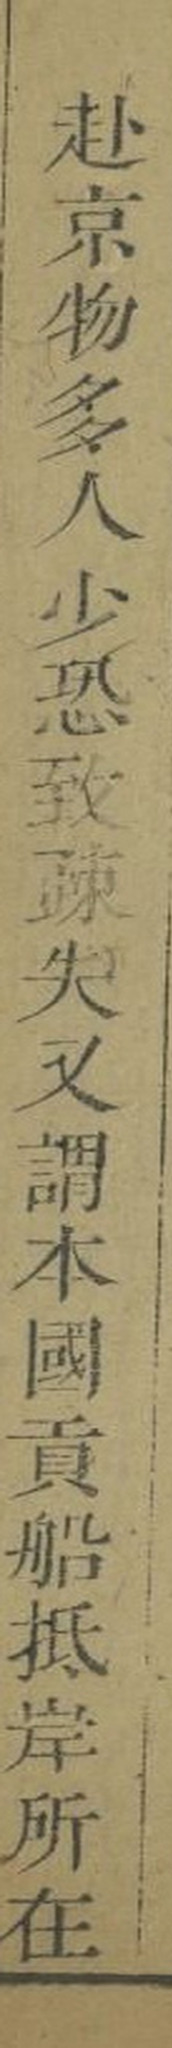赴京物多人少恐致疎失又謂本国貢船抵岸所在
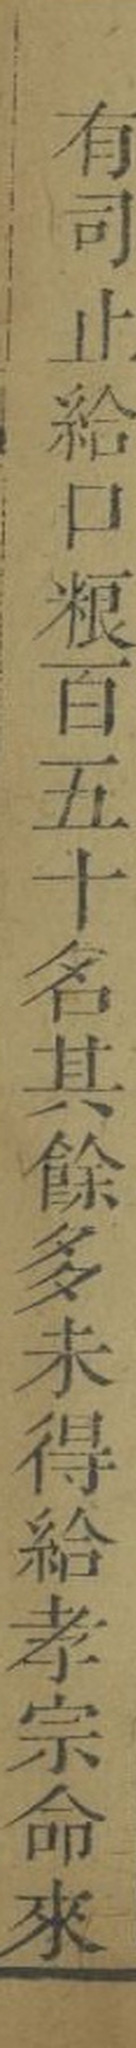有司止給口粮百五十名其余多未得給孝宗命来

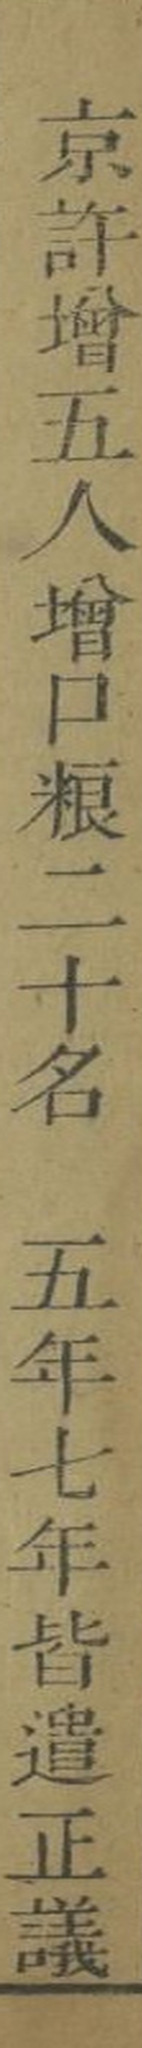京許増五人増口粮二十名五年七年皆遣正議
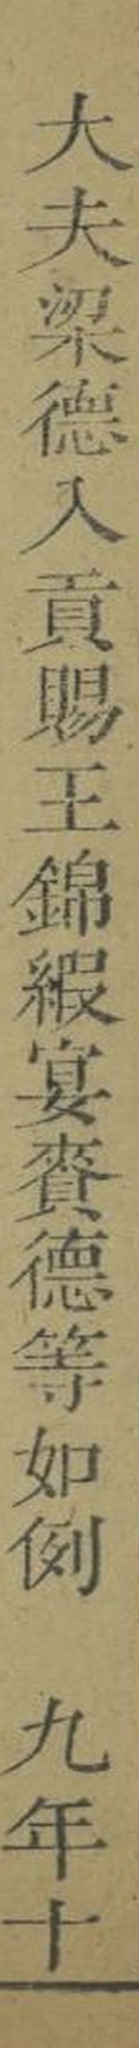大夫梁徳入貢賜王錦緞宴賚徳等如例九年十
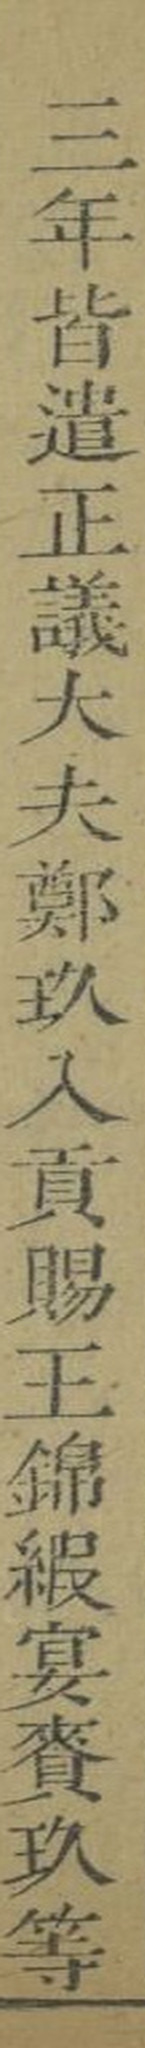三年皆遣正議大夫鄭玖入貢賜王錦緞宴賚玖等
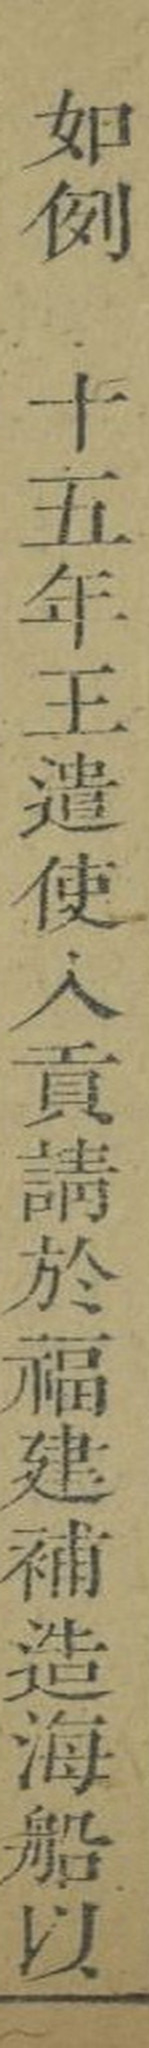如例十五年王遣使入貢請於福建補造海船以
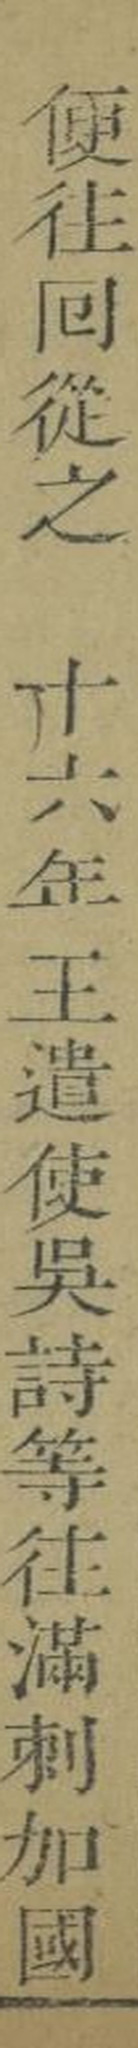便往回従之十六年王遣使呉詩等往満刺加国
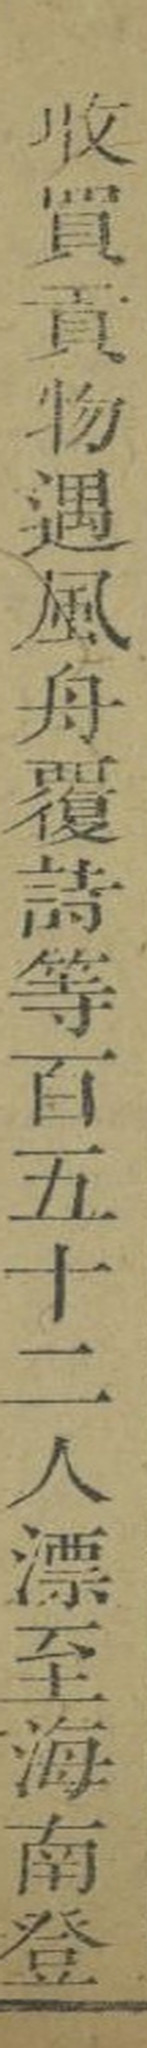収買貢物遇風舟覆詩等百五十二人漂至海南登
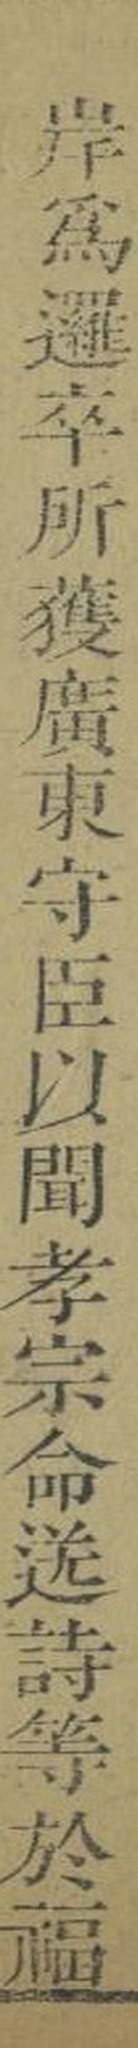岸為邏卒所獲広東守臣以聞孝宗命送詩等於福
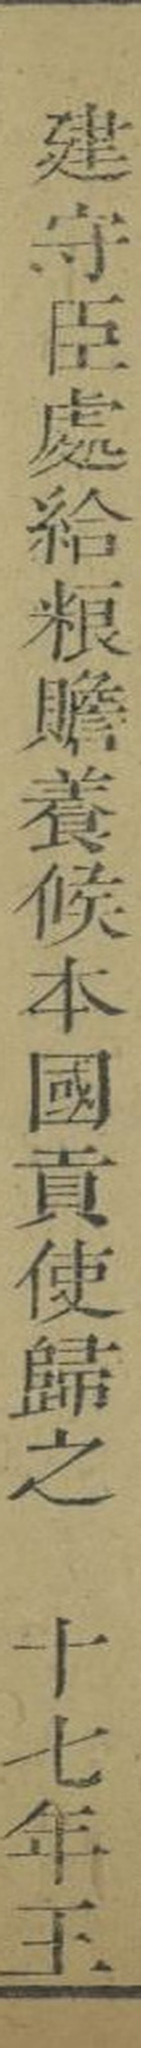建守臣処給粮贍養候本国貢使帰之十七年王
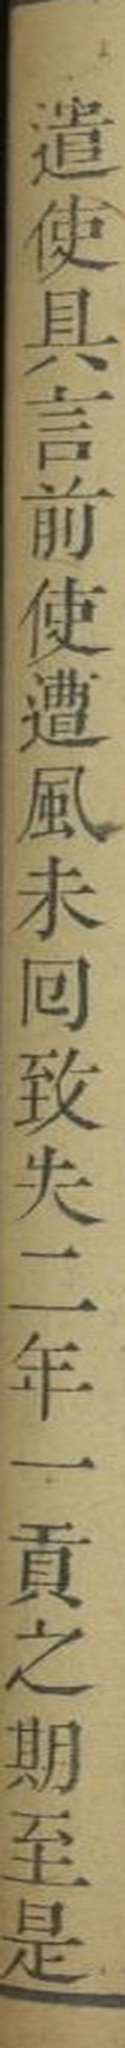遣使具言前使遭風未回致失二年一貢之期至是
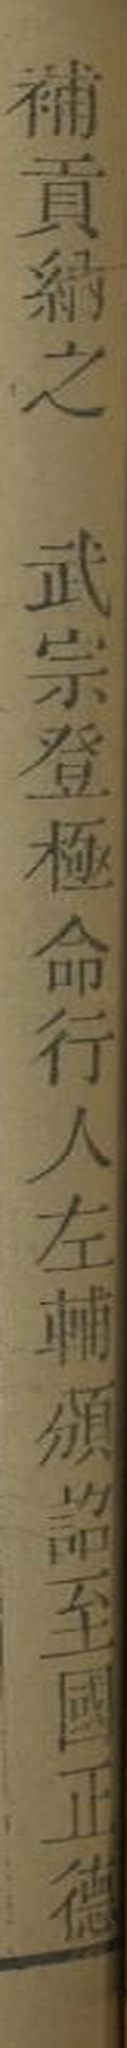補貢納之武宗登極命行人左輔頒詔至国正徳
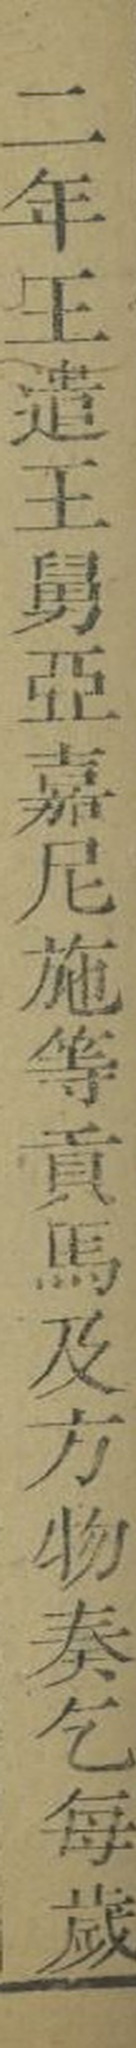二年王遣王舅亜嘉尼施等貢馬及方物奏乞毎歳
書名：中山伝信録 巻三
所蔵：University of the Ryukyus Library
